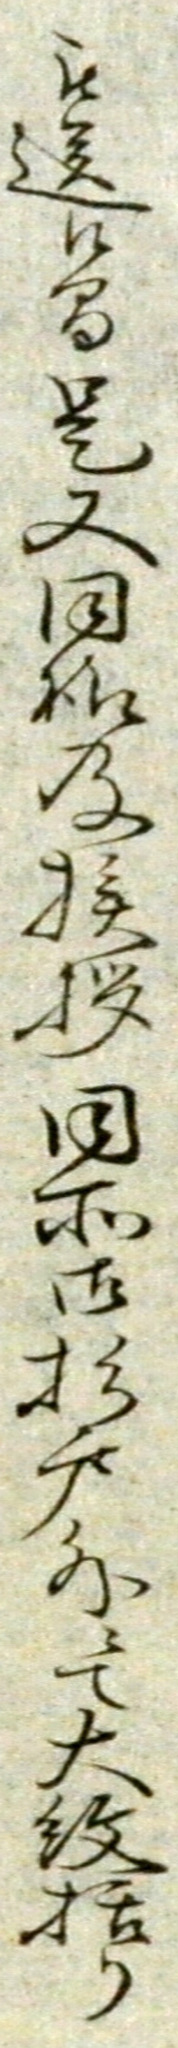被送候間是又同様及挨拶同所御杉戸外ニ而大紋括り
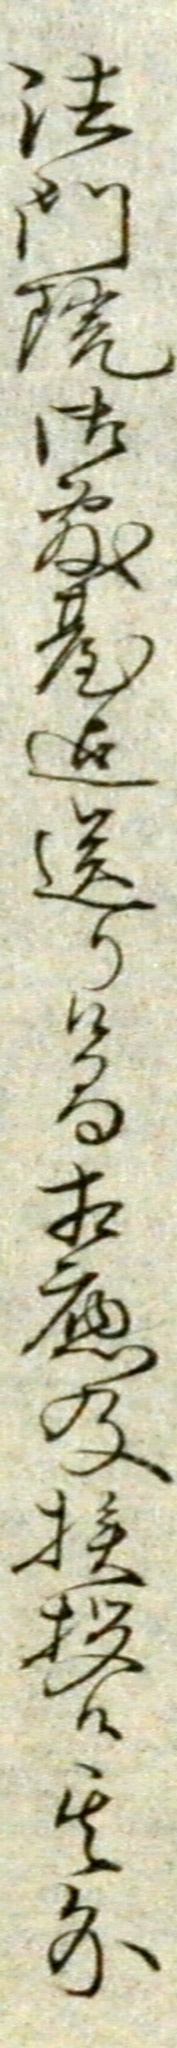法門院御敷臺迠送り候間相応及挨拶候其外

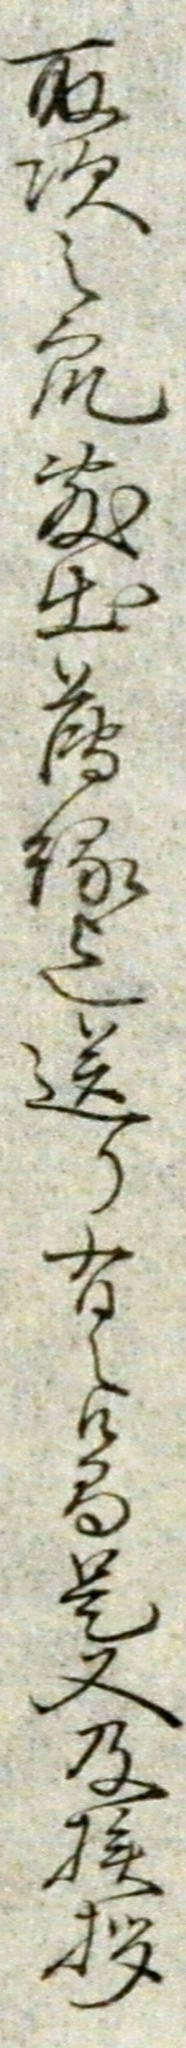取次之衆敷出薄縁迄送り有之候間是又及挨拶
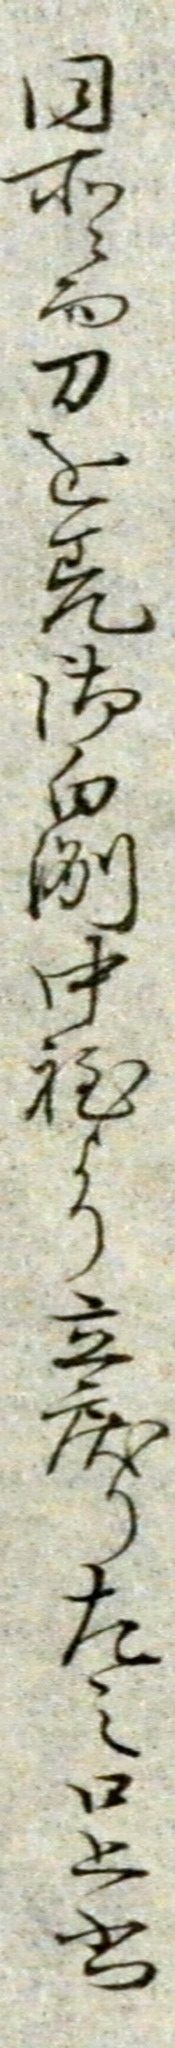同所ニ而刀を差御白洲中程より立戻り左之口上書
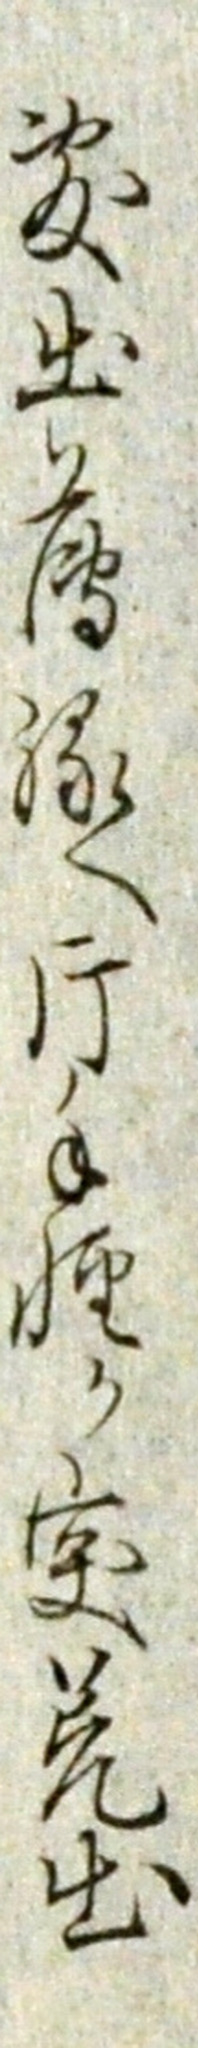敷出薄縁へ片手軽ㇰ突差出
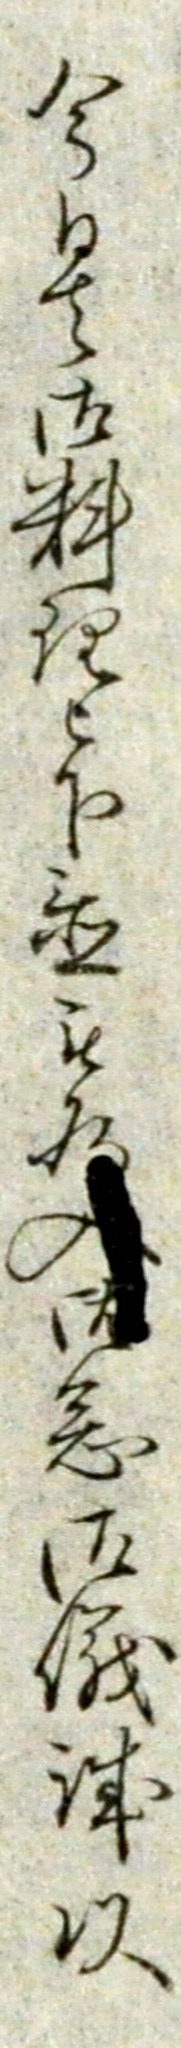今日者御料理被下置被為入御念御儀誠以
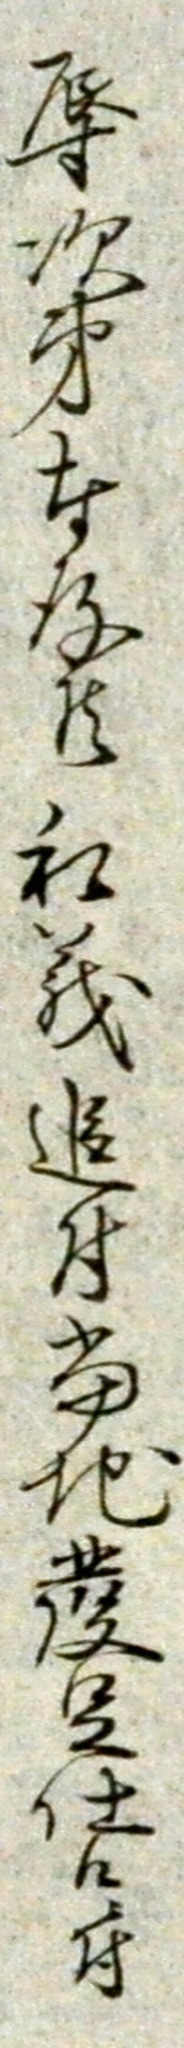辱次第奉存候私義追付当地発足仕候ニ付
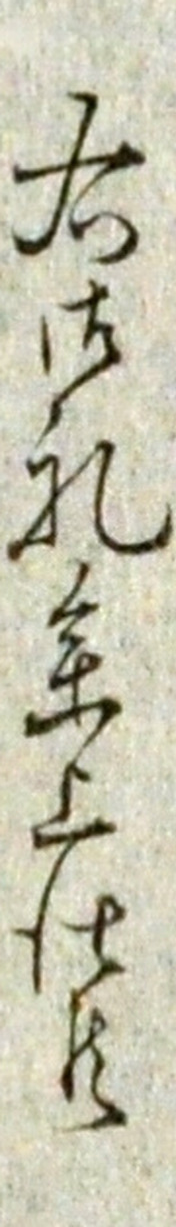右御礼参上仕候
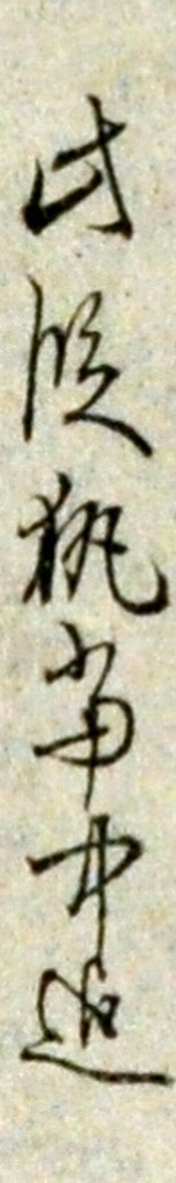此段執当中迄
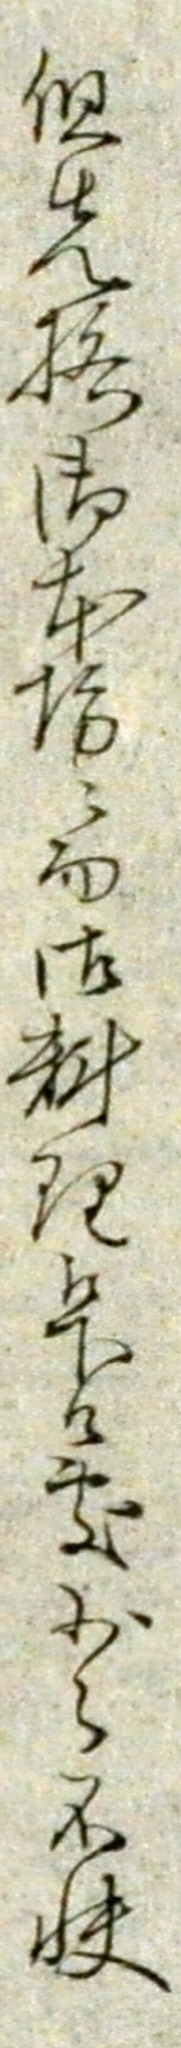但先格御本坊ニ而御料理被下候処少々不快
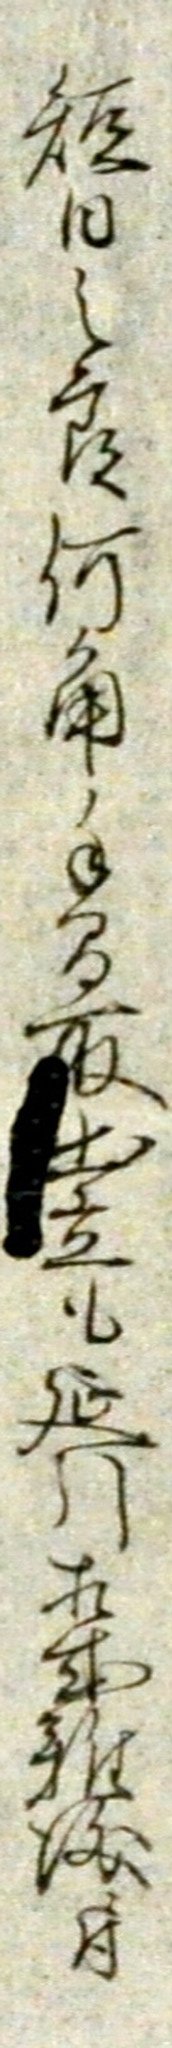短日之節何角手間取出立も延引相成難儀ニ付
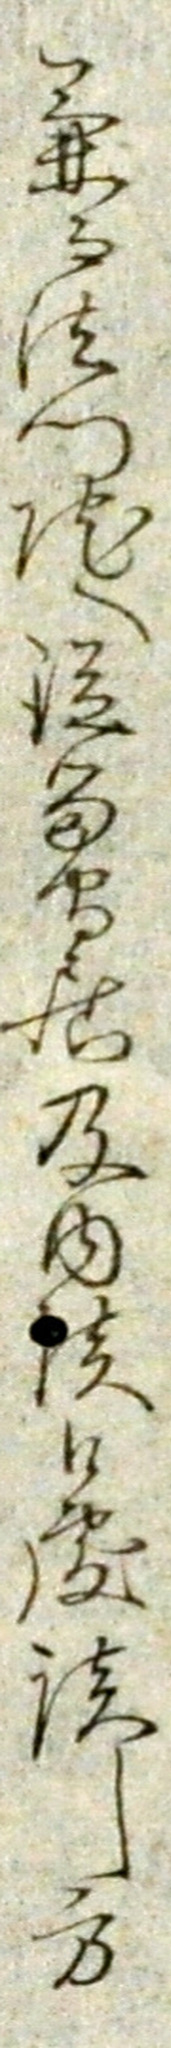兼而法門院へ従留守居及内談候処談し方
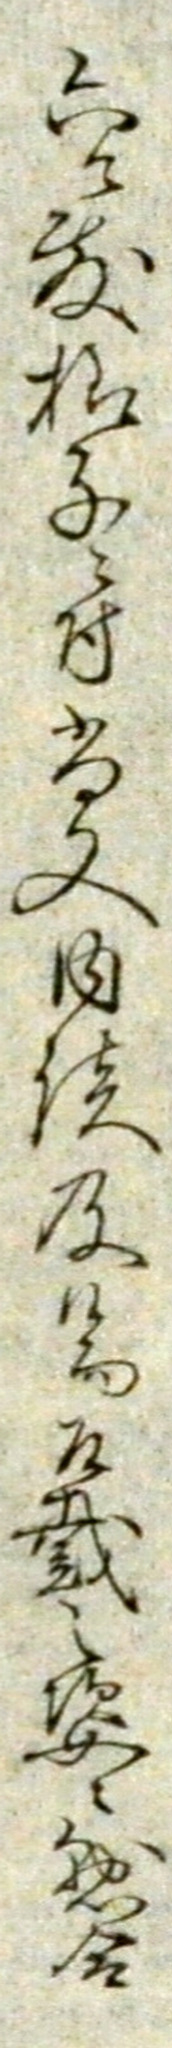六ヶ敷様子ニ付尚又内談及候て頂戴之姿に懸合
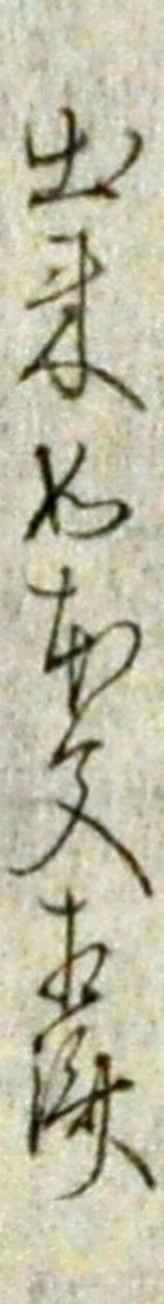出来如本文相済
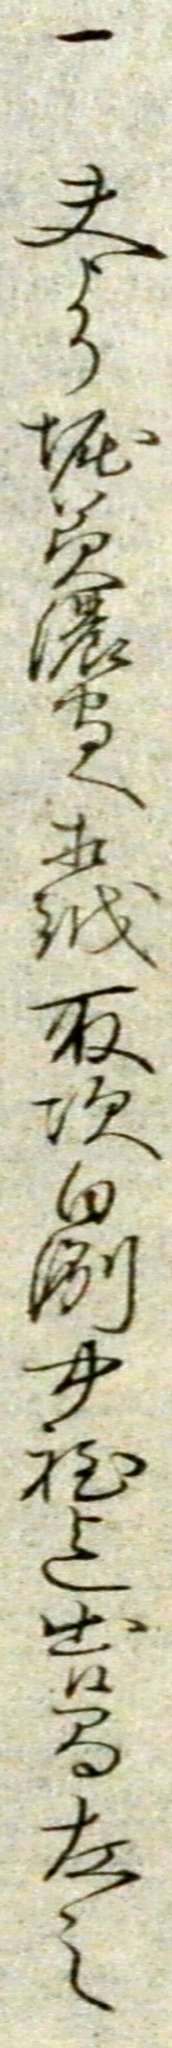一夫より堀美濃守へ相越取次白洲中程迄出候間左之
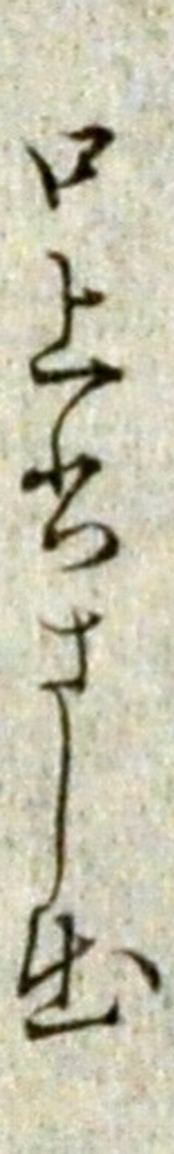口上書さし出
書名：日光御名代相勤候節ノ留
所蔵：伊那市立高遠町図書館・合同会社AMANE
